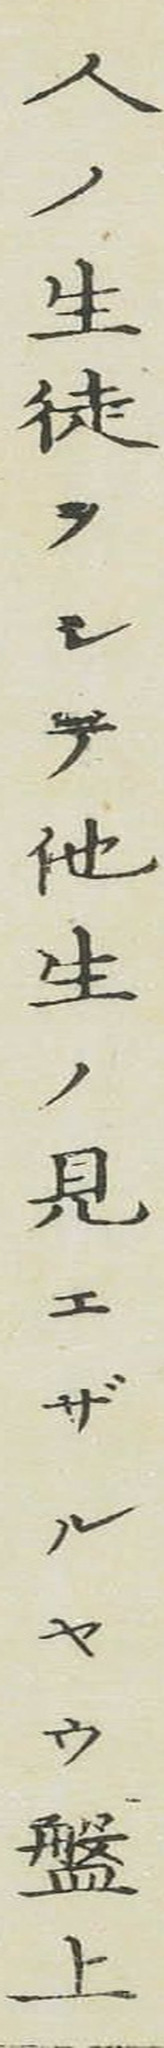人ノ生徒ヲシテ他生ノ見エザルヤウ盤上
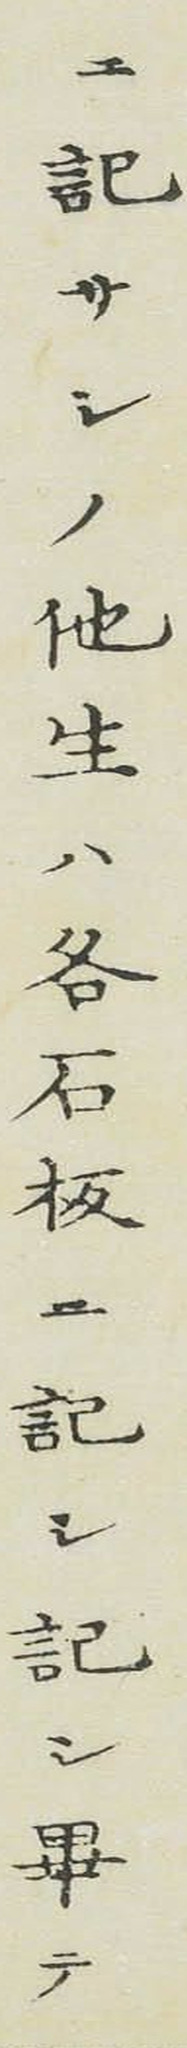ニ記サシノ他生ハ各石板ニ記シ記シ畢テ
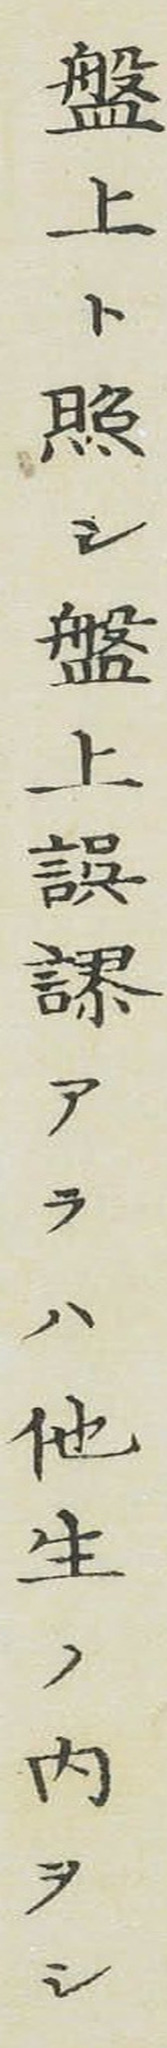盤上ト照シ盤上誤謬アラハ他生ノ内ヲシ
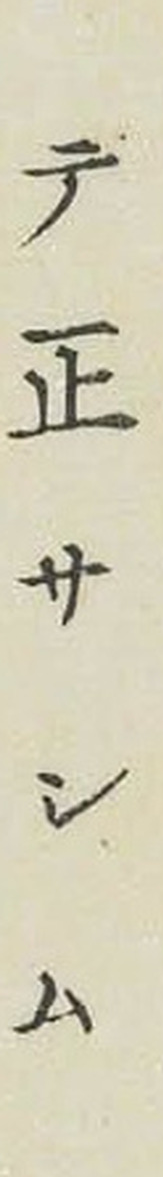テ正サシム
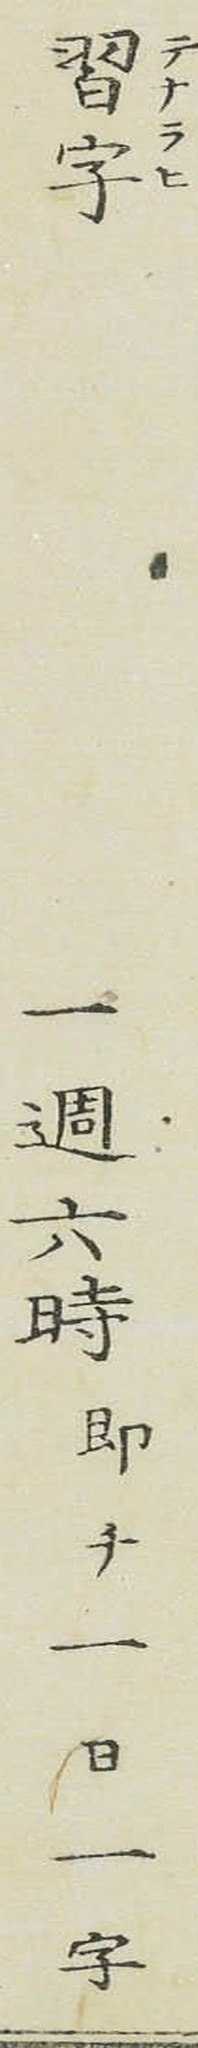習字一週六時即チ一日一字
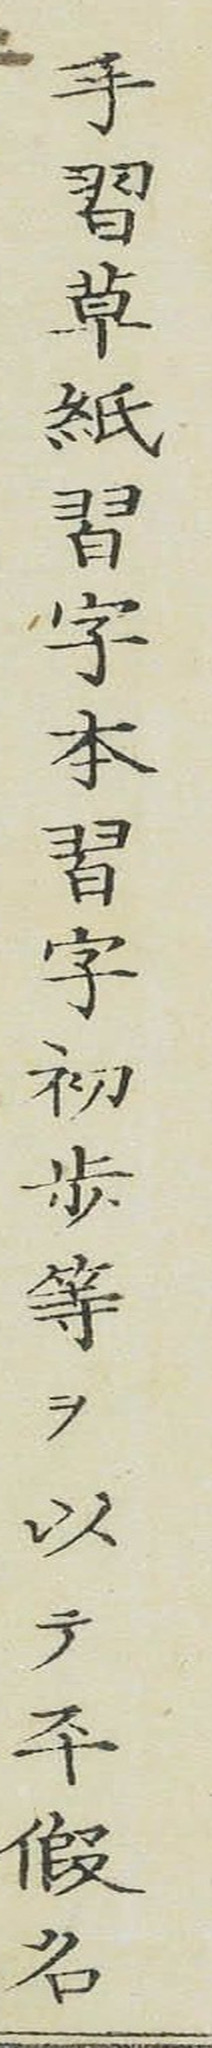手習草紙習字本習字初歩等ヲ以テ平仮名
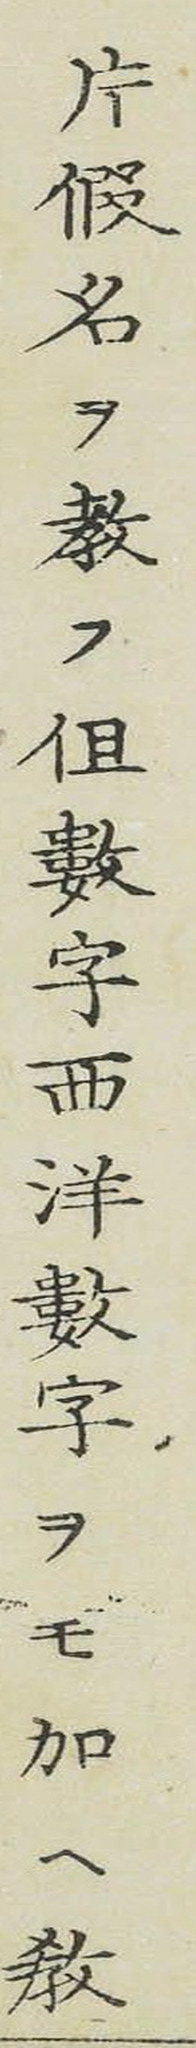片仮名ヲ教フ但数字西洋数字ヲモ加ヘ教
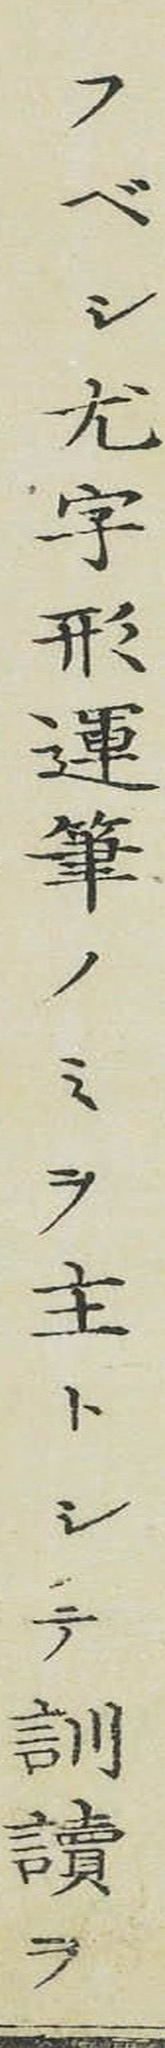フベシ尤字形運筆ノミヲ主トシテ訓読ヲ
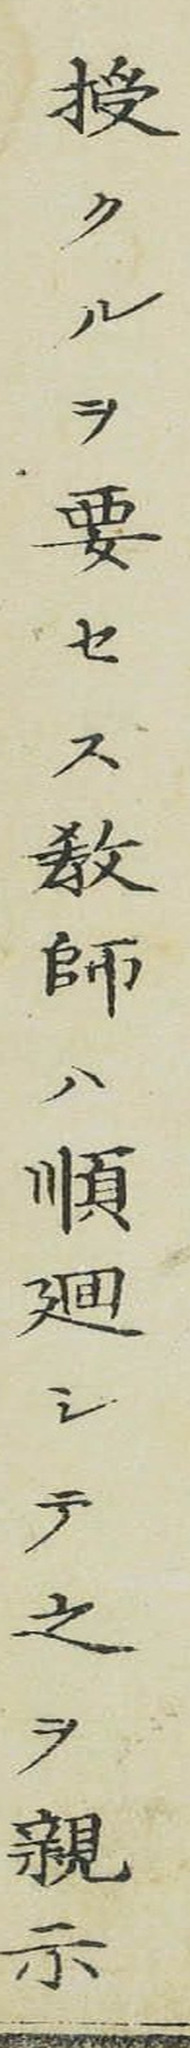授クルヲ要セス教師ハ巡廻シテ之ヲ親示

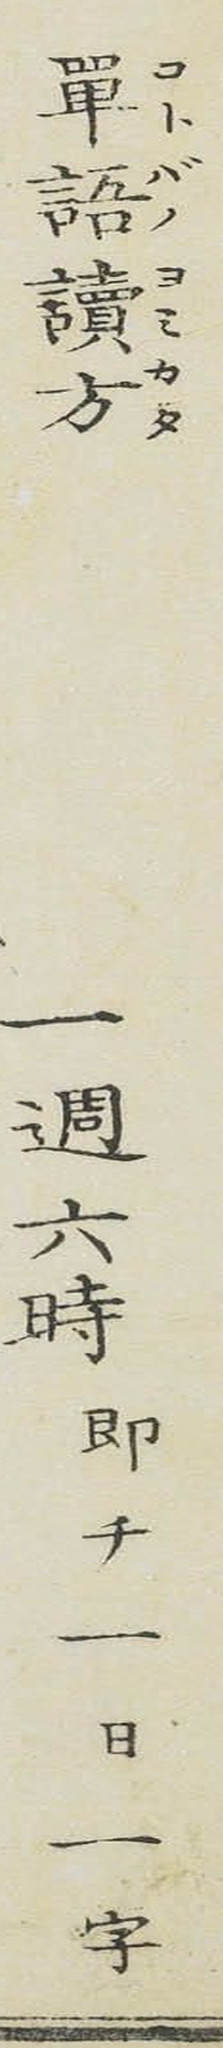単語読方一週六時即チ一日一字
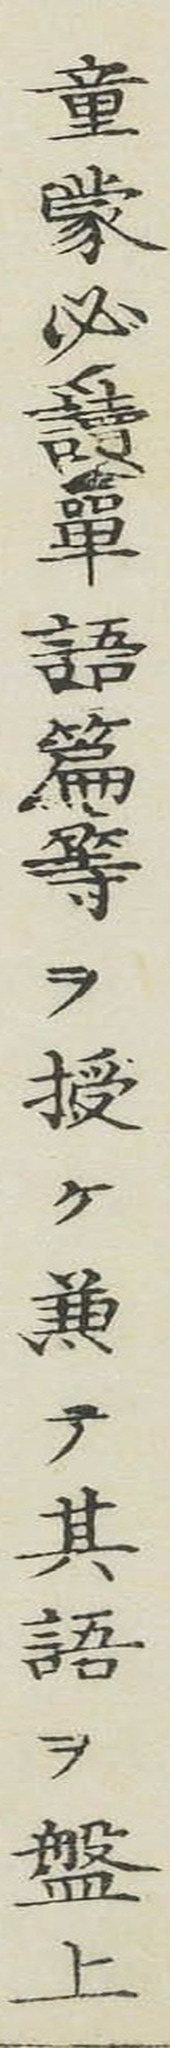童蒙必読単語篇等ヲ授ケ兼テ其語ヲ盤上
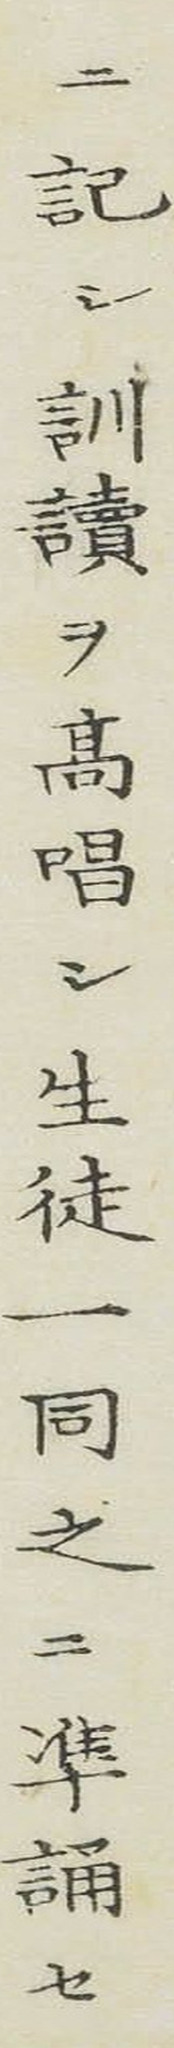ニ記シ訓読ヲ高唱シ生徒一同之ニ準誦セ
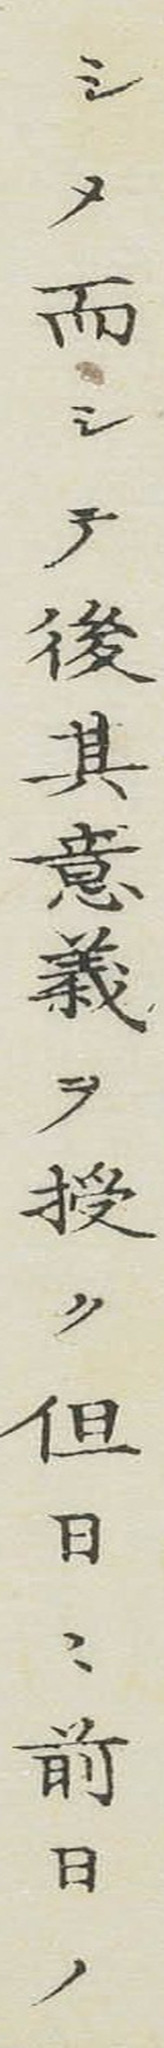シメ而シテ後其意義ヲ授ク但日ヽ前日ノ
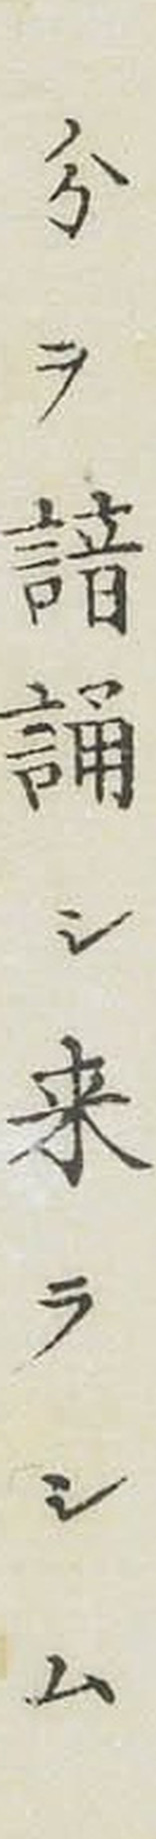分ヲ諳誦シ来ラシム
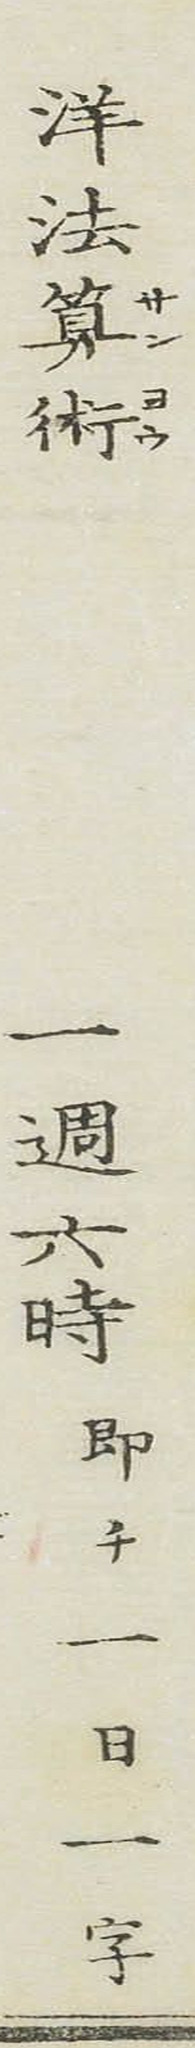洋法算術一週六時即チ一日一字
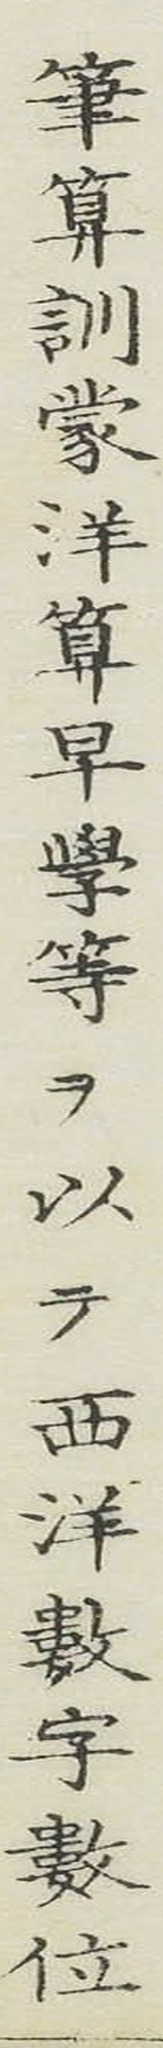筆算訓蒙洋算早学等ヲ以テ西洋数字数位
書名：小学教則
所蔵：東京学芸大学教育コンテンツアーカイブ
